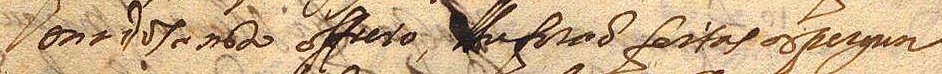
ma do santo officio, lhe foraõ feitas as pergun
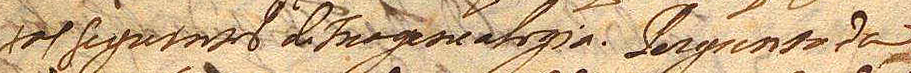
tas seguintes de sua genealogia. Perguntada
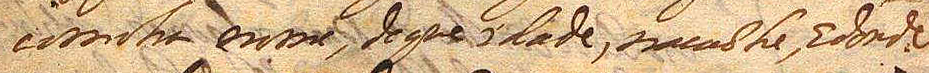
como ha nome, de que idade, nacaõ he, E donde
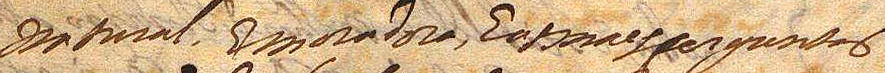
natural. E moradora, E as maes perguntas
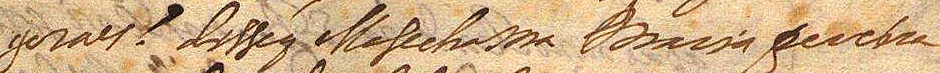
geraes? disse q̄ ella se chama Maria pereira
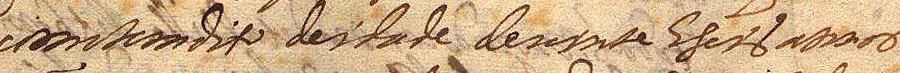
como tem dito de idade de uinte E seis annos
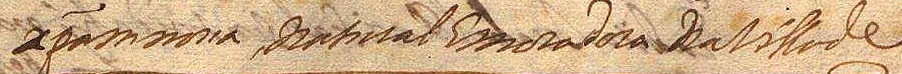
xpām noua, natural e moradora na Villa de
